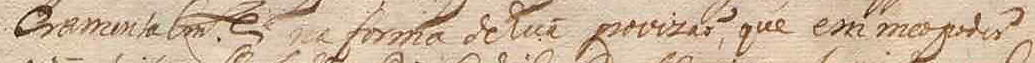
Cramentalm.te na forma de huā provizaõ, que em meo poder
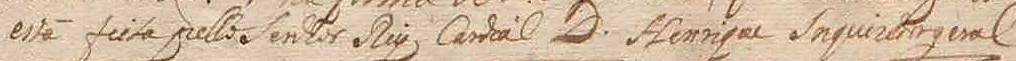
está feita pello Senhor Rey Cardial D. Henrique Inquizidor geral
